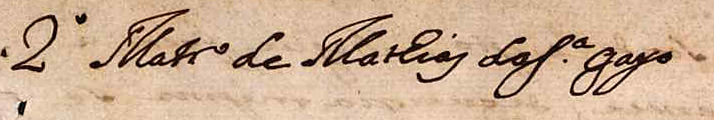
2 Matr.o de Mathias da S.a gayo
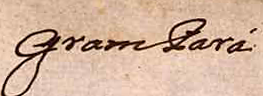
Gram Pará
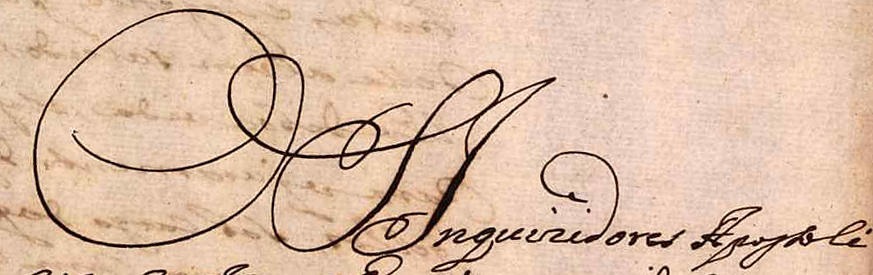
Aos Inquizidores Apostoli
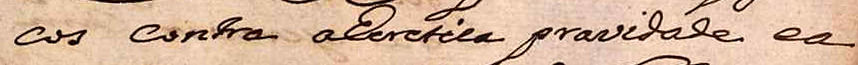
cos contra a heretica pravidade e a
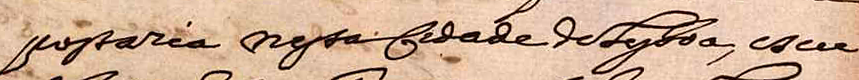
postazia nesta Cidade de Lisboa, e seu
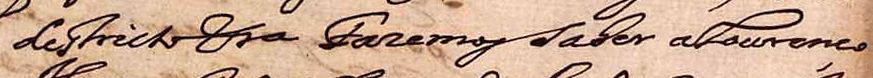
destricto &ra Fazemos saber a Lourenço
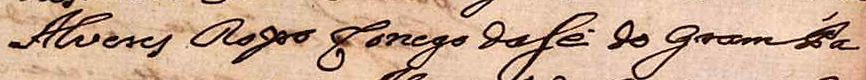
Alveres Roxo Conego da sé do Gram Pa
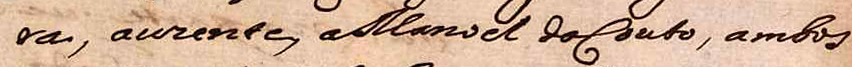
ra, auzente, a Manoel do Couto, ambos
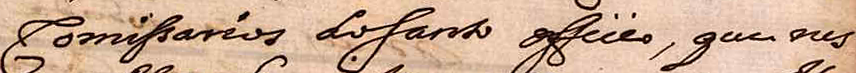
Comissarios do santo officio, que nes
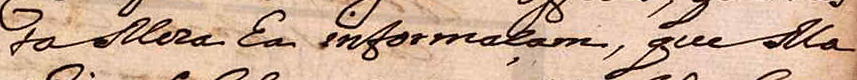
ta Meza ha informaçam, que Ma
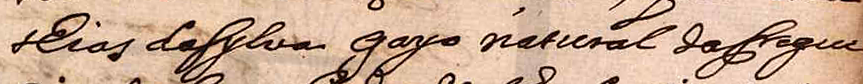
thias da Sylva gayo natural da fregue
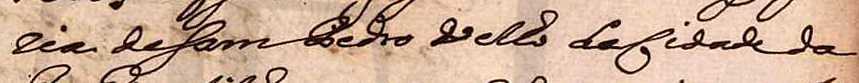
zia de sam Pedro Velho da Cidade da
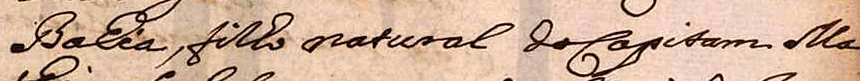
Bahia, filho natural do Capitam Ma
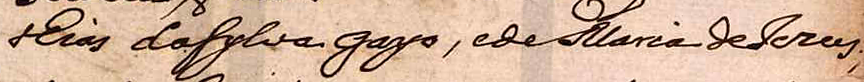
thias da Sylva gayo, e de Maria de Iezus,
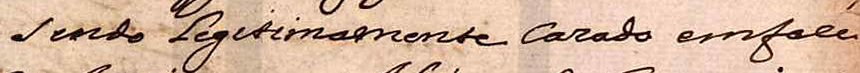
sendo Legitimamente cazado em face
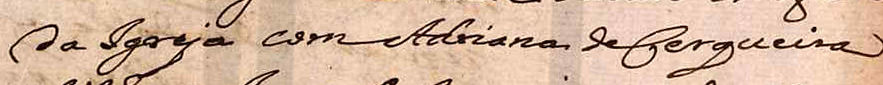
da Igreja com Adriana de Cerqueira
